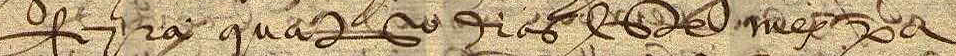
fejra quatro dias deste mes pa
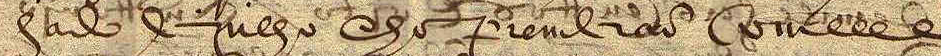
sado de Julho e ho prenderaõ Com elle
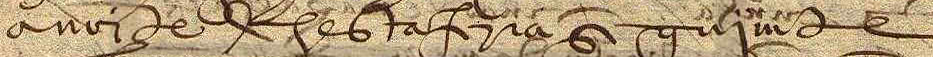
a noite de sesta fejra segujmte
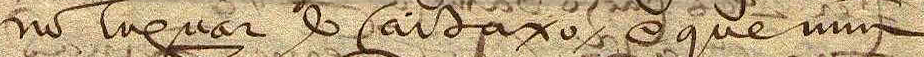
no luguar do Cartaxo / e que nun
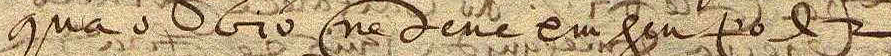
qua o vio nē teue em seu poder
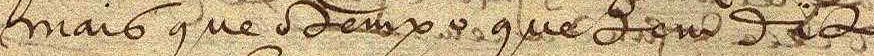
mais que o tempo que tem dito
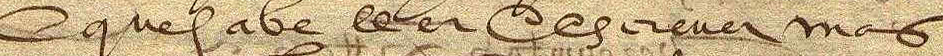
e que sabe ller e escreuer mas
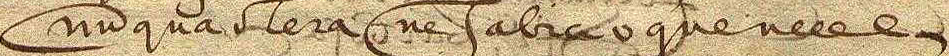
nūqua o lera n̄e Sabia o que nelle
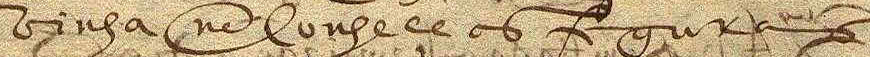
vinha n̄e Conheçe as feguras
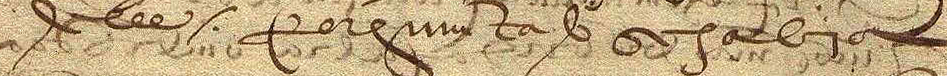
delle /. pergumtado se sabia
